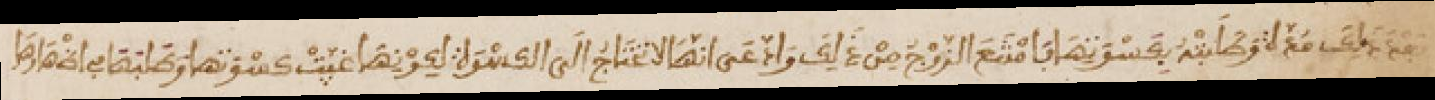بعد ذلك مدة وطلبته بكسوتها فامتنع الزوج من ذلك وادعى انها لا تحتاج الى الكسوة لكونها غيبت كسوتها وطلبها في إظهارها
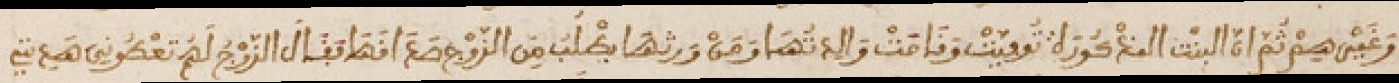وغيرهم ثم ان البنت المذكورة توفيت وقامت والدتها ومن ورثها يطلب من الزوج صداقها فقال الزوج لهم تعطوني هديتي
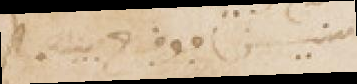سنين فوقع بينهما
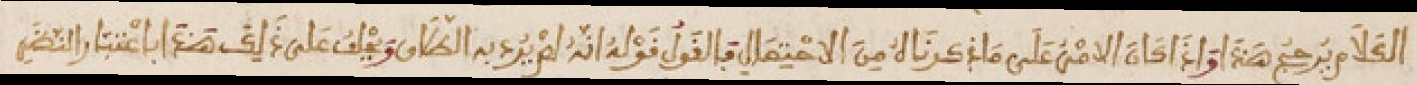الكلام يرجح هذا واذا كان الامر على ما ذكرناه من الاحتمال فالقول قوله انه لم يرد به الطلاق ويحلف على ذلك هذا باعتبار النظر
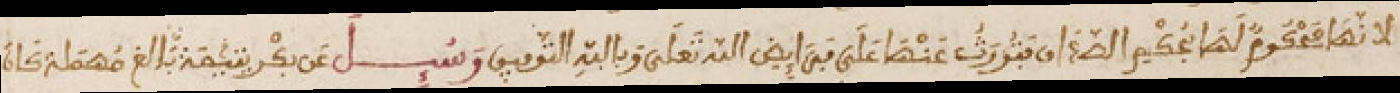لانها محكوم لها بحكم الصداق فتورث عنها على فرائض الله تعلى وبالله التوفيق وسئل عن بكر يتيمة بالغ مهملة كان
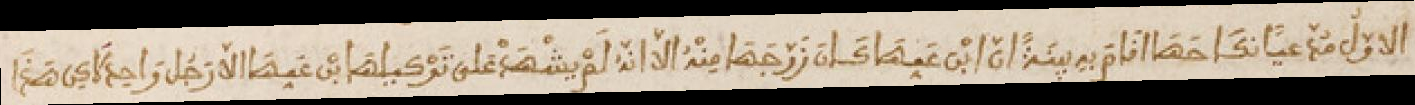الاول مدعيا نكاحها اقام به بينة ان ابن عمها كان زوجها منه الا انه لم يشهد على توكيلها بن عمها الا رجل واحد لاكن هذا
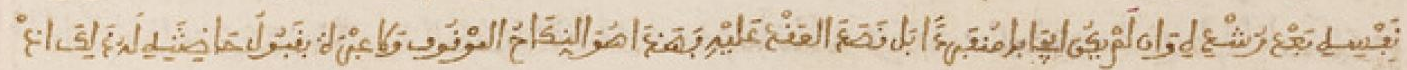نفسه بعد رشده و ان لم يكن إيجابا منفردا بل قصد العقد عليه فهذا هو النكاح الموقوف ولا عبرة بقبول حاضنته له ذلك اذ
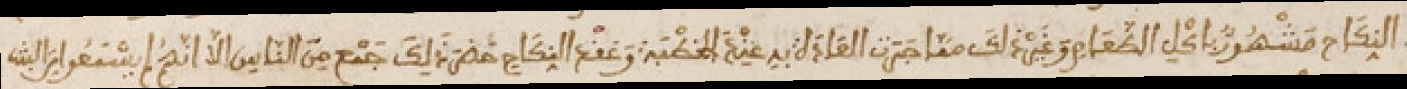النكاح مشهورا باكل الطعام وغير ذلك مما جرت العادة به عند الخطبة و عقد النكاح حضر ذلك جمع من الناس الا انهم لم يسمعوا من البنت
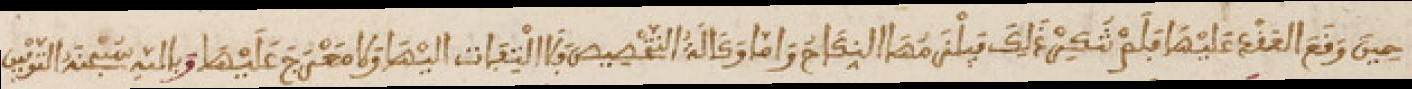حين وقع العقد عليها فلم تتكر ذلك فيلزمها النكاح واما وكالة التخصيص فلا التفات اليها ولا معرج عليها وبالله سبحانه التوفيق
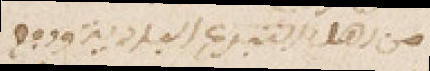من اهل التبرد البادية ودفع
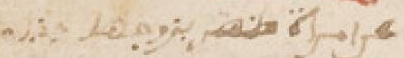عن امراة ظهر بزوجها جذام
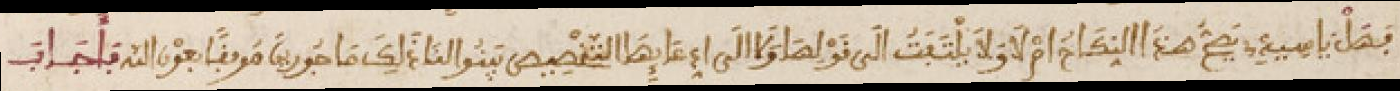فهل يا سيدي يصح هذا النكاح ام لا ولا يلتفت الى قولها ولا الى ادعائها التخصيص بينو لنا ذلك ماجورين موفقا بعون الله فاجاب
